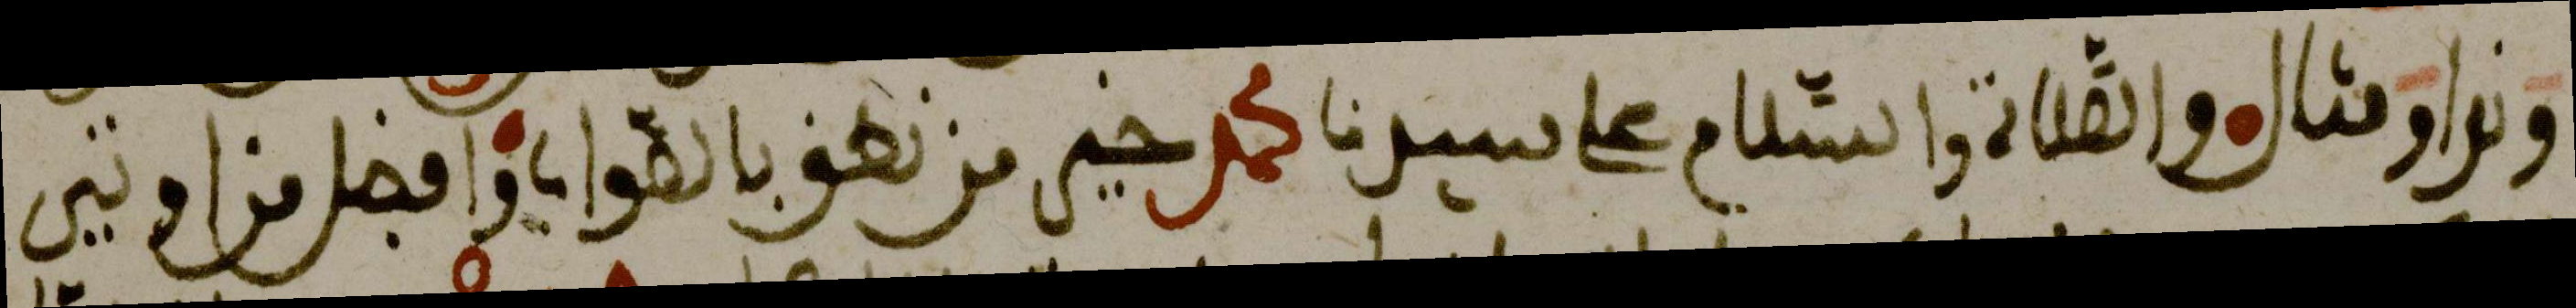ونداو مثال والصّلاة والسّلام على سيدنا محمد خير من نطق بالصّواب وافضل من اوتي
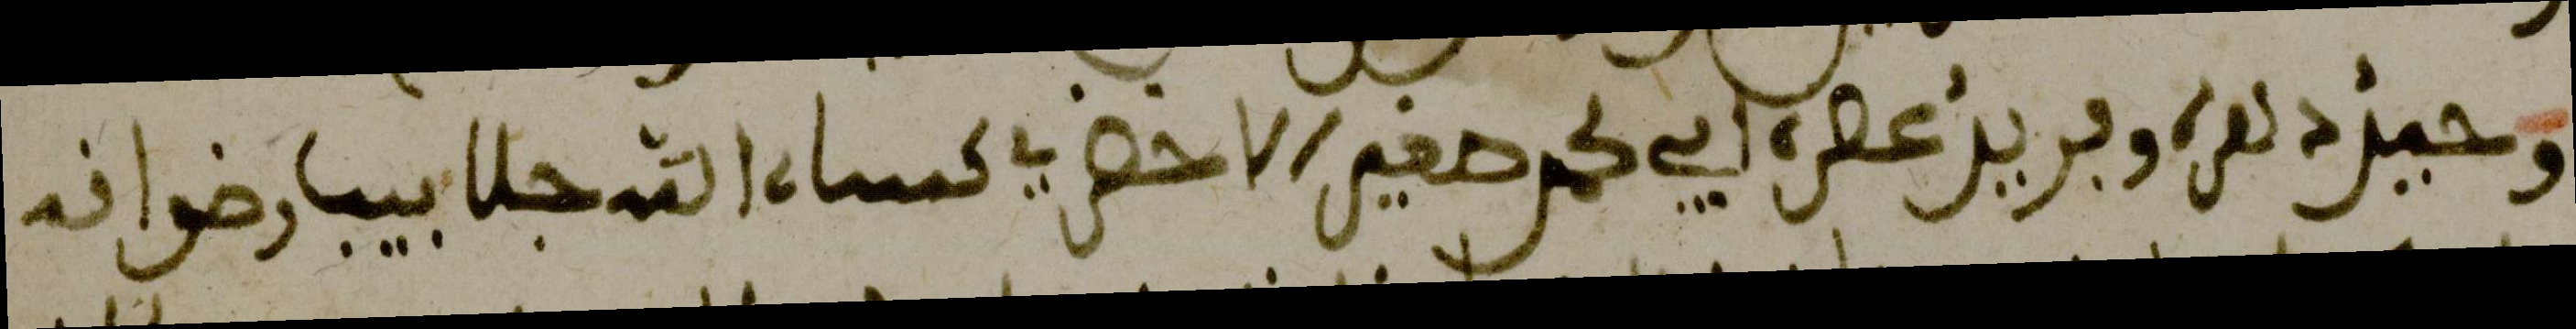وحيد دهره وفريد عصره ابي محمد صغير الاخضري كساه الله جلابيب رضوانه
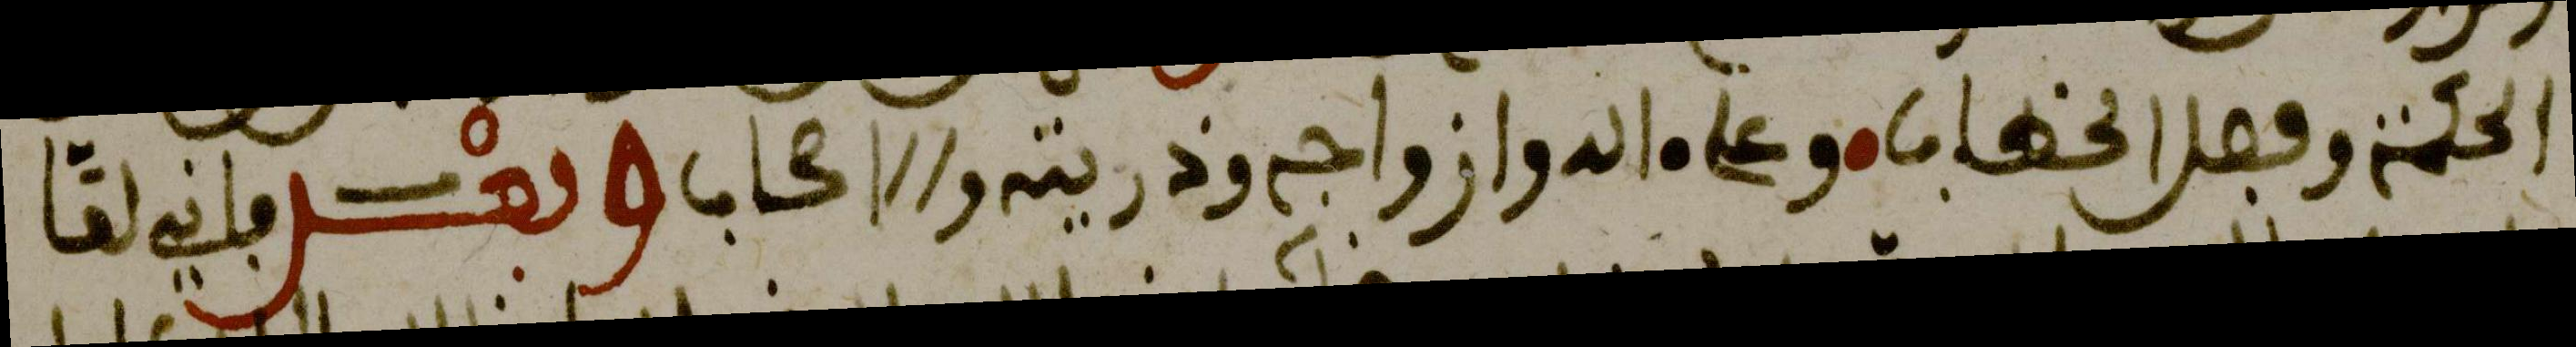الحكمة وفصل الخطاب وعلى ءاله وازواجه وذريته والاصحاب وبعد فاني لمّا
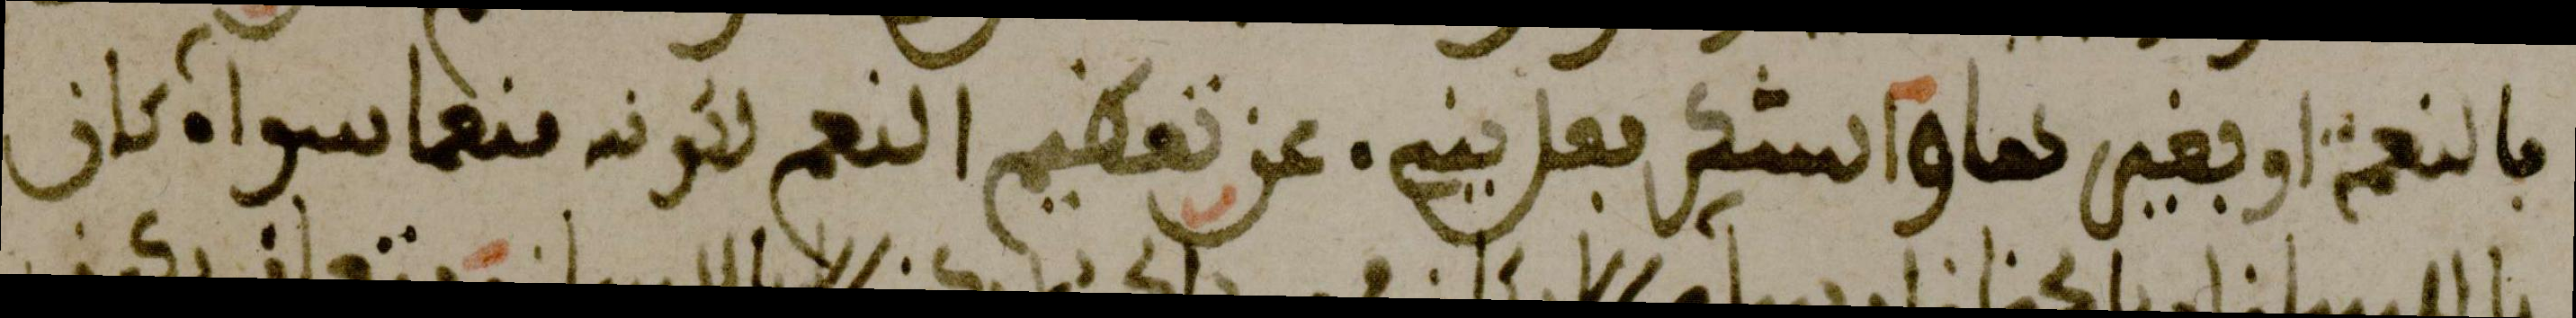بالعمة اوبغير هاوالشكر فعل ينيء عن تعظيم النعم لكو نه منعما سواء كان
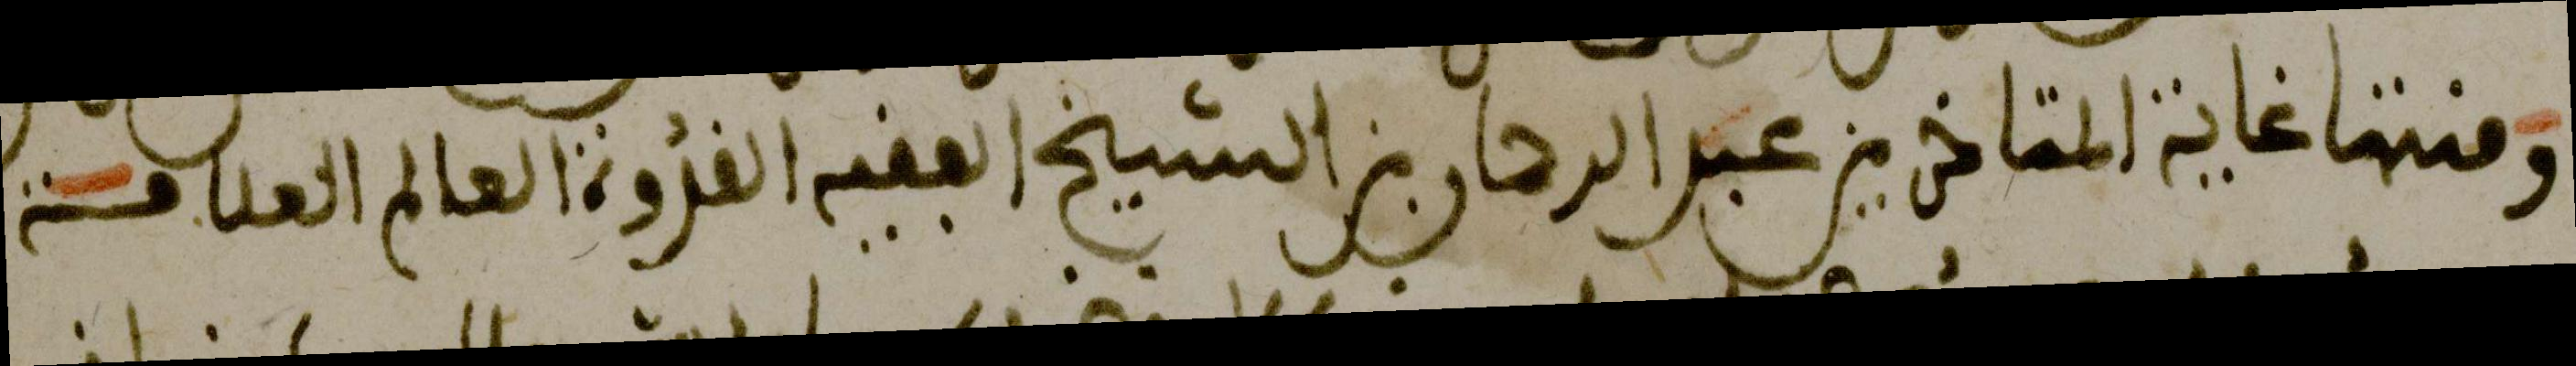ومنتها غاية المتاخرين عبد الرحمان بن الشيخ الفقيه القدوة العالم العلامة
